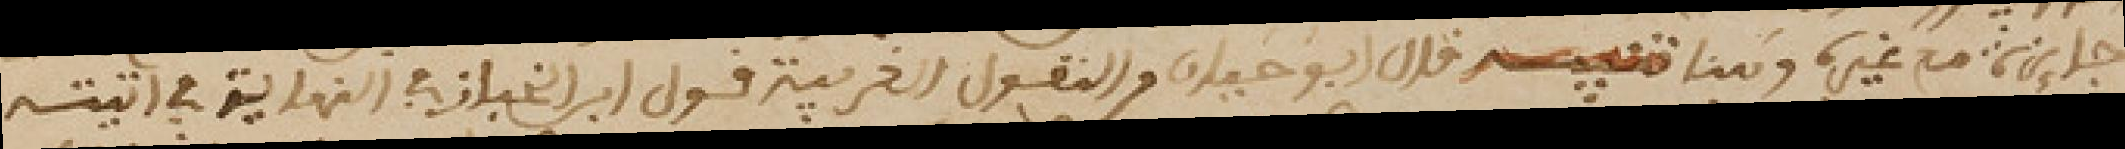جائزة مع غيره و هنا # قال ابو حيان من النقول الغريبة قول ابن الخباز في النهاية في اتيته
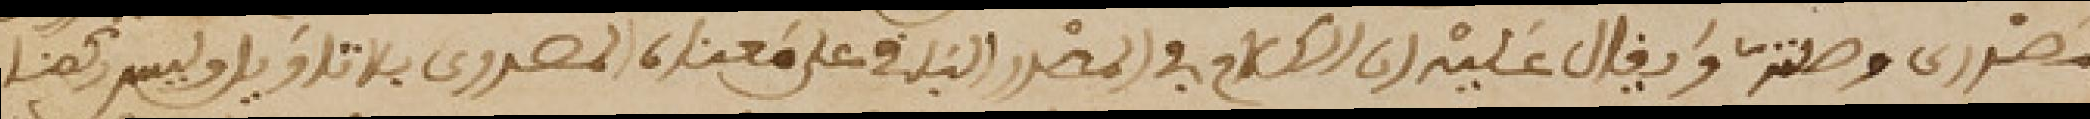مضررى و صلته و يقال عليه ان الكلام في المضر البلاغي على معناه المصروى بلا تاويل و ليس ركضا
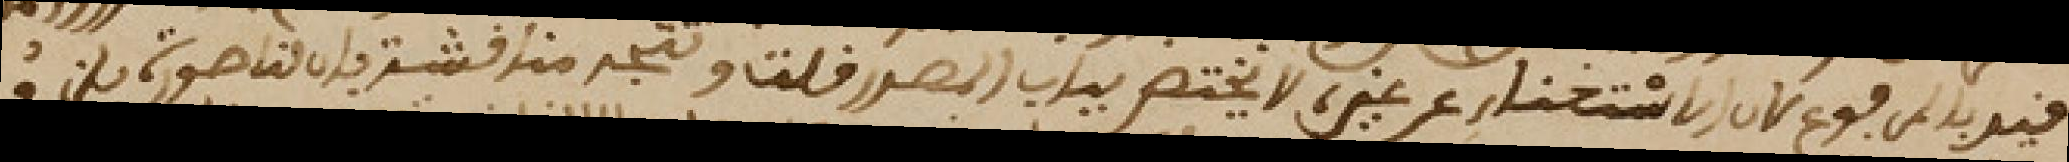فيه المرفوع لان استغناء عن غيره لا يختص بباب المصدر قلت و تتجه منا قشة بان لنا صورة يلزم
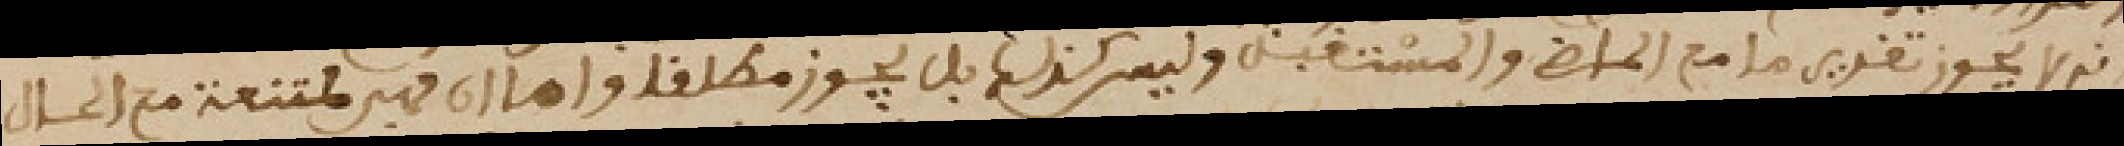انه لا يجوز تقرير ما مع الماضي و المستقبل و ليس كذلك بل يجو ز مطلقا و اما ان فهي ممتنعة مع الحال
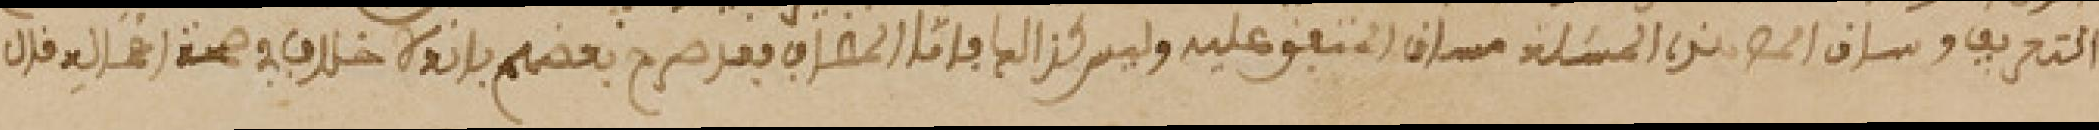التعريف و ساق المص هذه المسئلة مساق المتفق عليه و ليس كذلك باتا المضاف بعد صرح بعضهم بان بانه لا خلاف في صحة اجماله قال
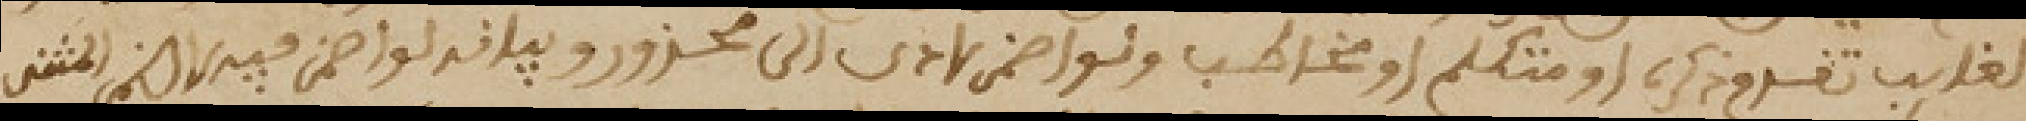لغايب تقوم ذكره او متكلم او مخاطب ولو اضمر ادى الى محروزو بما انه لو اضمر فيه لاضمر المثنى
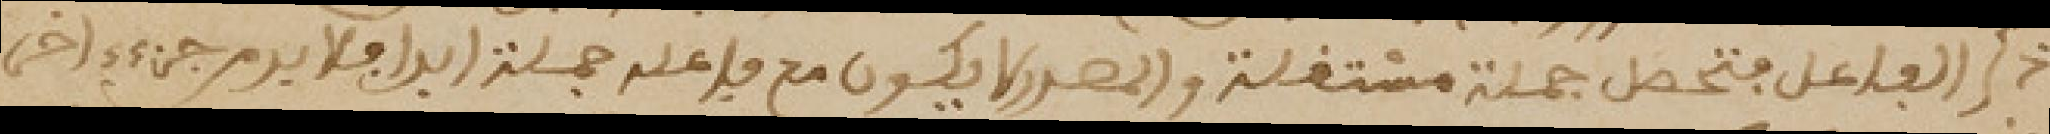ذكر الفاعل فتحصل جملة مستقلة و المصدر لا يكون مع فاعله جملة ابذا فلا يدمجن بلغة
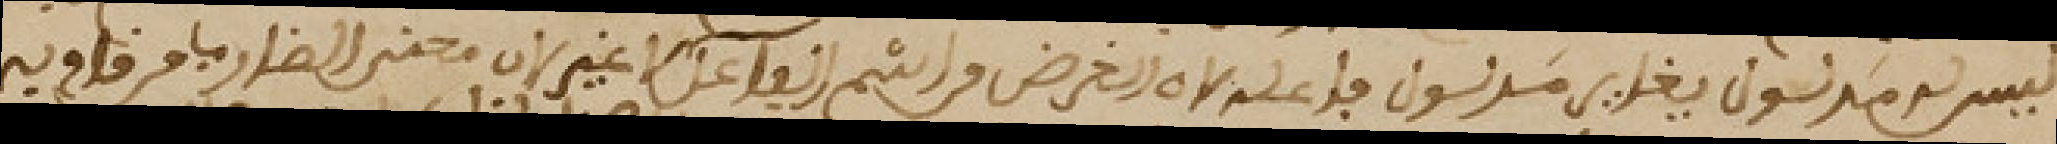ليس له مدلول يغاير مدلول فاعله لان الغرض من اسم الفاعل لا غير لان معنى الضارب من فامه به
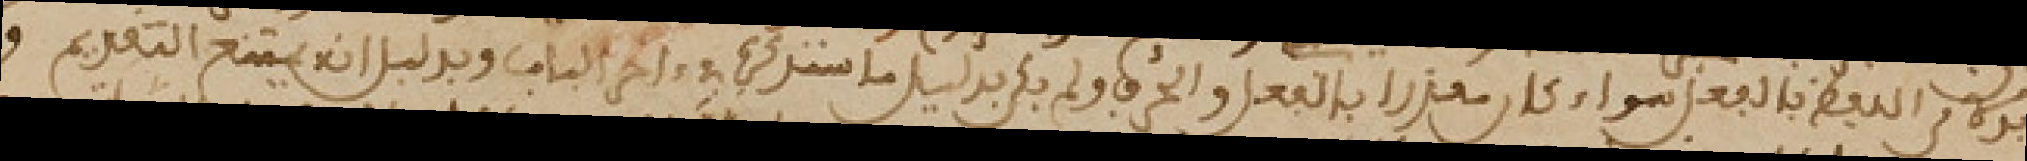بدلا من اللفظ بالفعل سواء كان معزرا بالفعل و الحرف و لم يكر بدليل ما استركره في ءاخر الباب و بدليل انه يتمنع التقديم
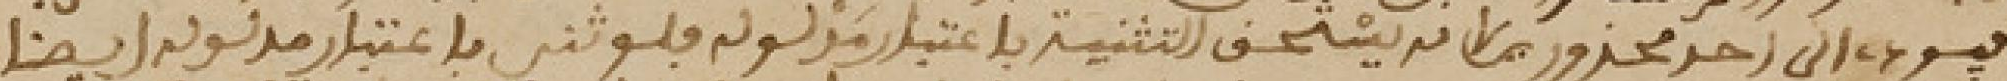بيودء الى احد محذورين انه يستحق التثنية باعتبار مدلوله فلوثني باعتبار مدلوله ايضا
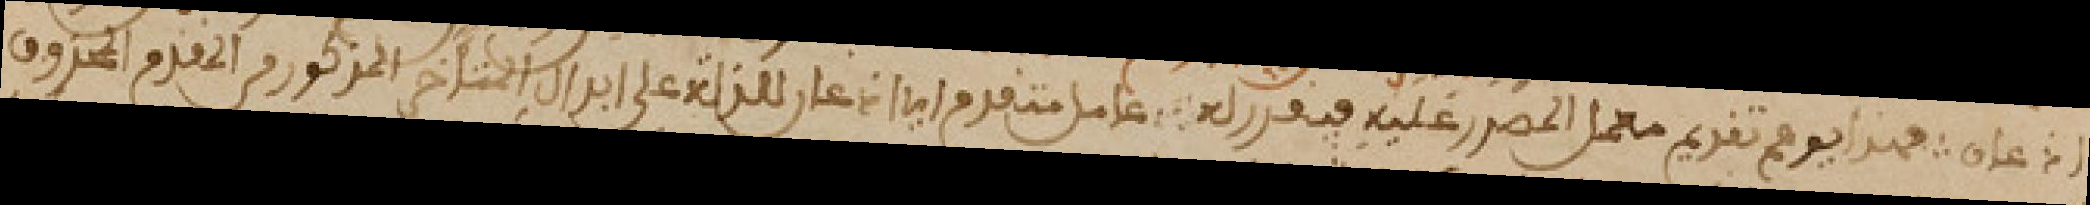اذ عان فهدا يوهم تقديم معمل المصدر عليه فيقرر له عامل متقدم اي اذعان للزلة على ابدال المتاحر المذكور في المقدم المحذوف
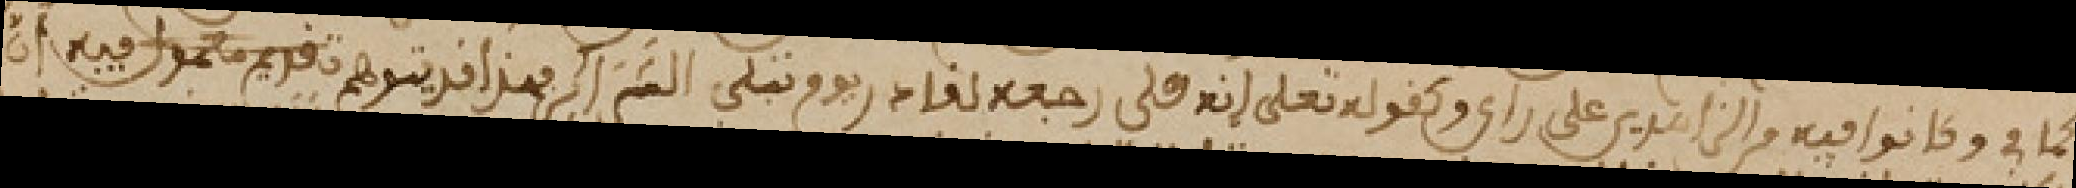كما في وكانوا فيه من الزاهدين على راى و كقوله تعلى انه على رجعه لقادر يوم تبلى الشراين بهذا قديتوهم تقديم معمول فيه ان
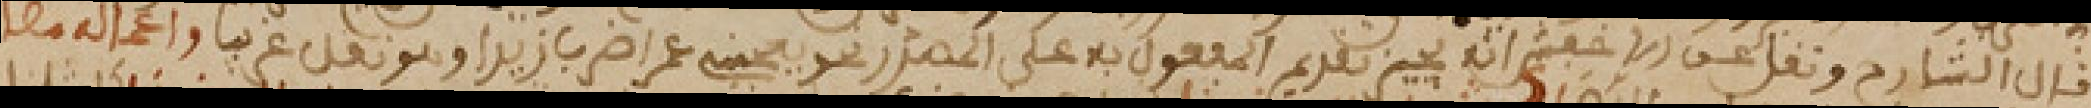قال الشارح وتقل عن الاخفش اته ان يجيز تقديم المفعول على المصدر نحو يعجبني عمر اضرب زيدا و هو تقل غريب و اعماله معا
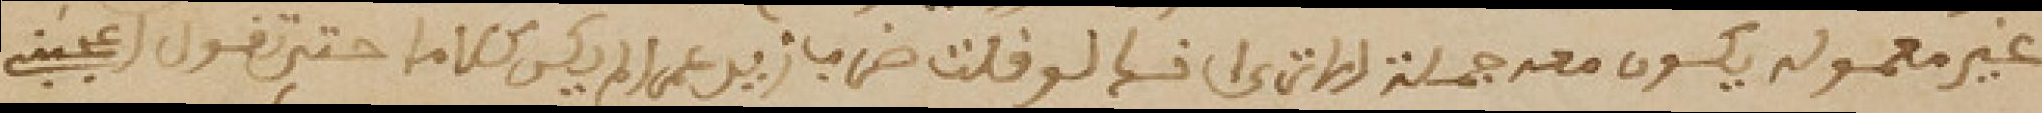غير معمولة يكون معه جملة لا ترى انك لو قلت ضرب زيد عمرا لم يكن كلاما حتى تقول اعجبني
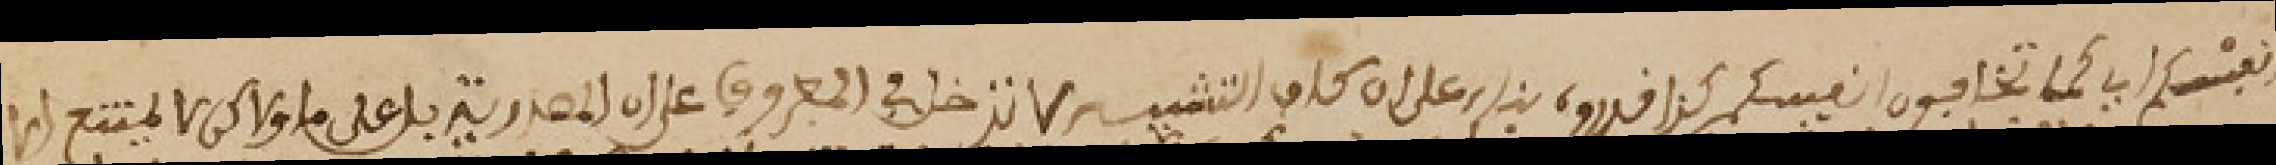انفسكم اي كما تخافون انفسكم كذا قرروه بناء على ان كاف التشبيه لا تدخل في المعروف على المصدرية بل على ما ولاكن لا يمتنع الا
